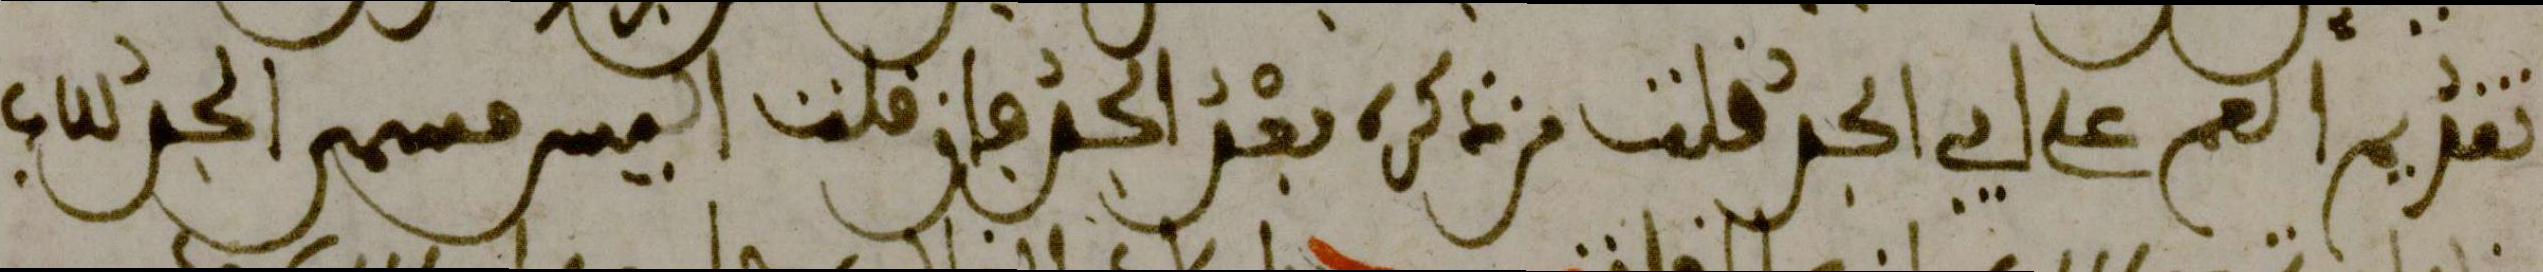تقديم العم على ابي الجد قلت من ذكره بعد الجد فان قلت اليس مسمى الجد للاب
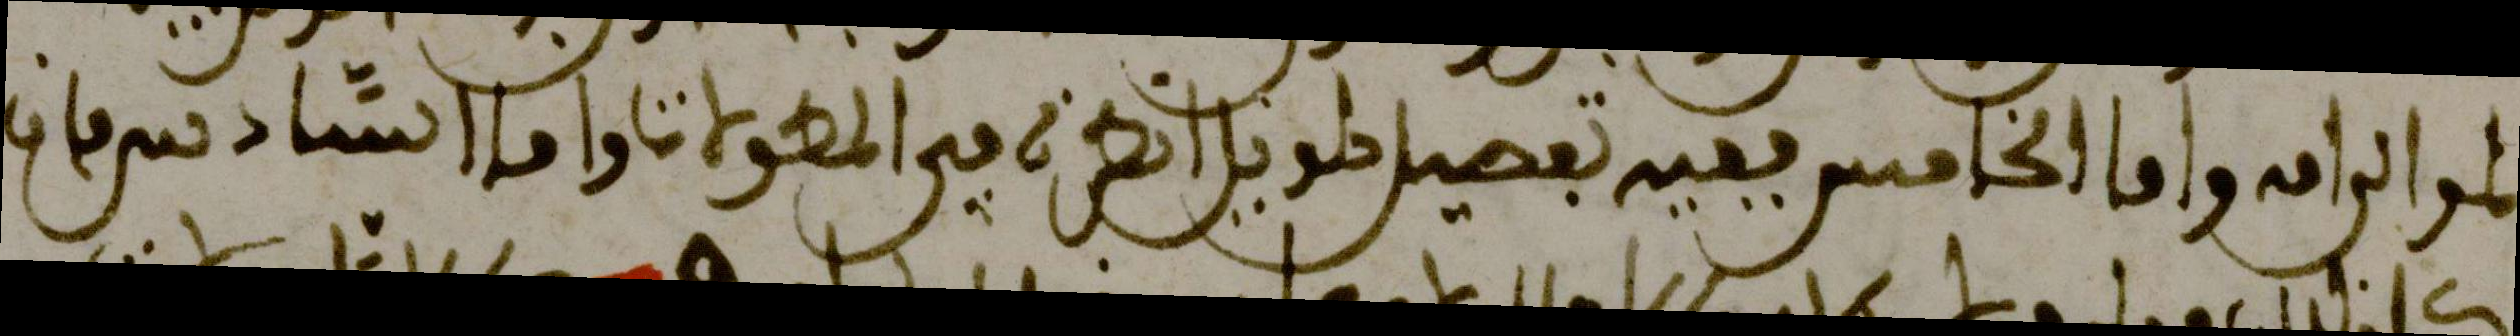لمو الى امه واما الخامس ففيه تفصيل طويل انظره في المطولات واما السّادس فان
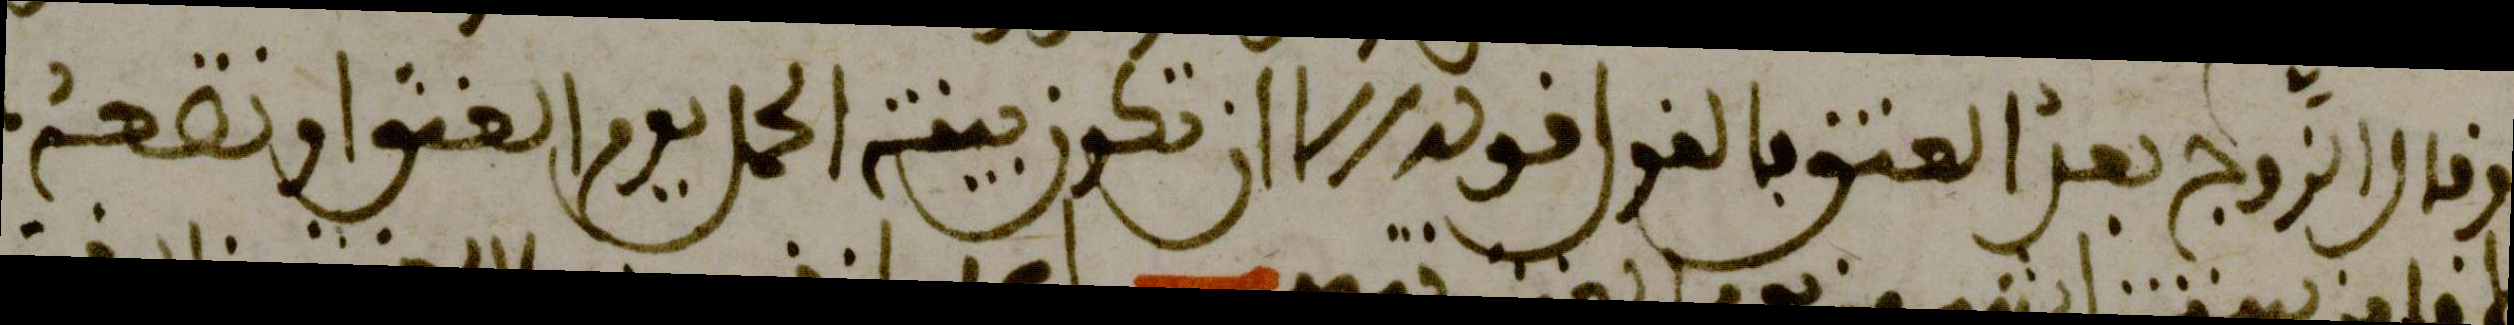وقال الزوج بعد العتق فالقول قوله الا ان تكون بينة الحمل يوم العتق او تضعه
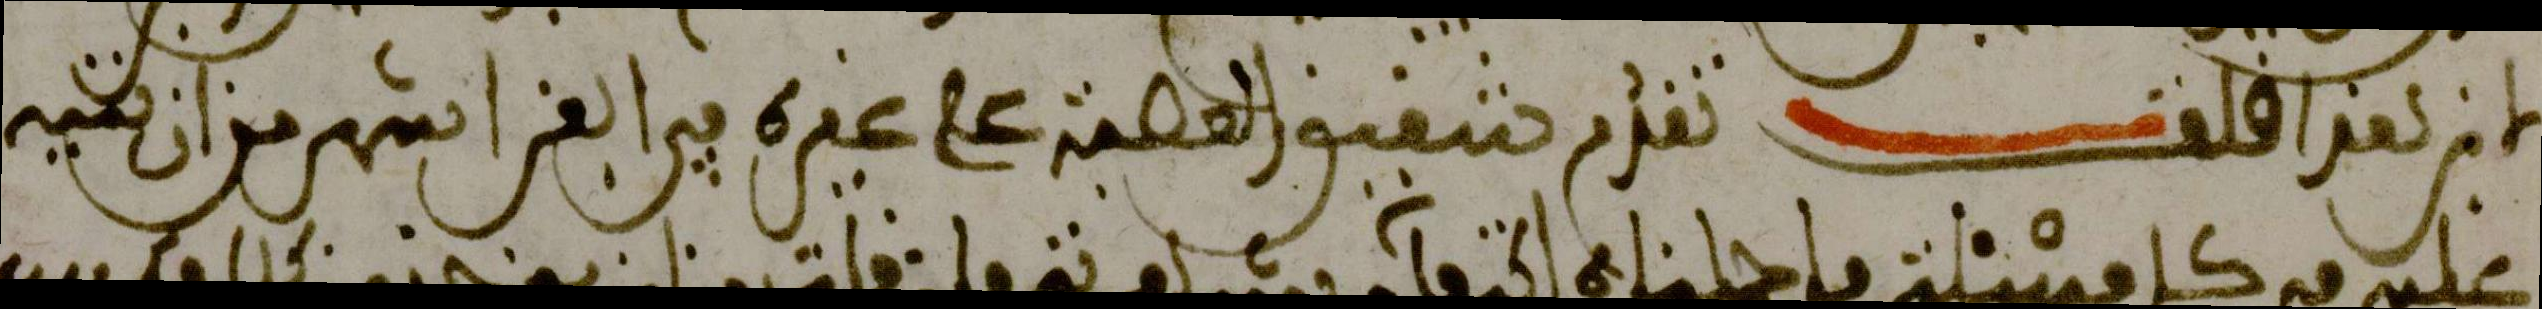لابن هذا قلت تقدم شقيق العصبة على غيره في الفن اشهر من ان ننيه
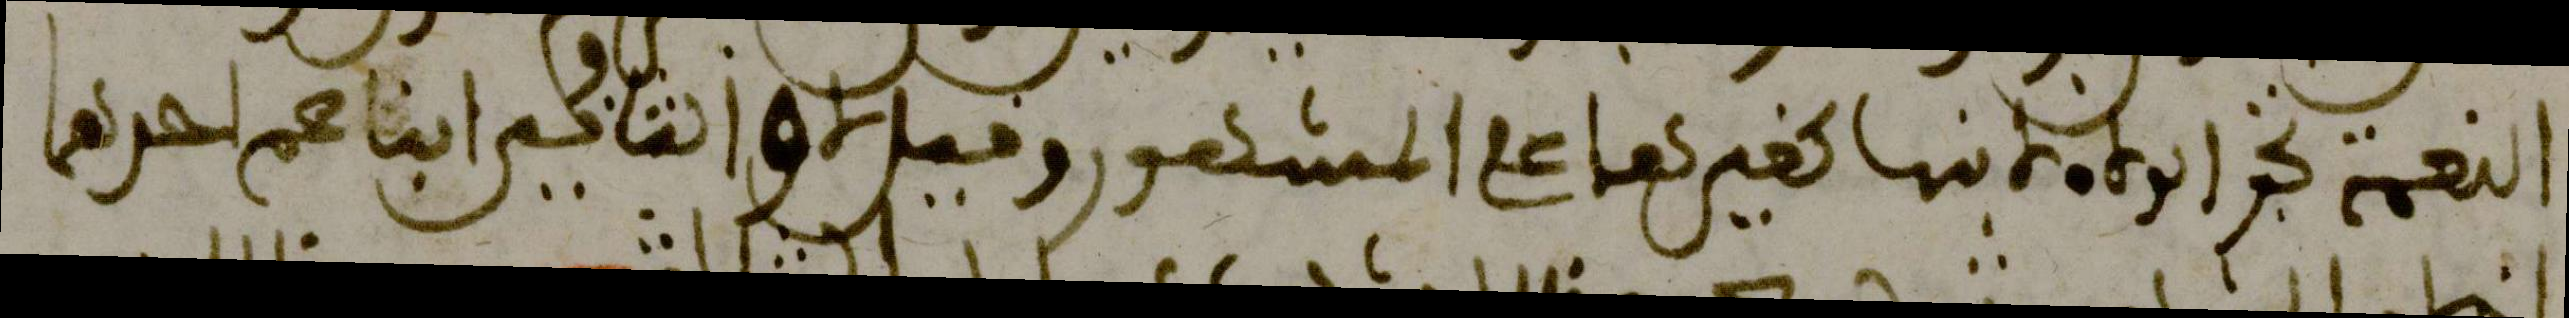النعمة تجز الولاء لانها كغيرها على المشهور وقيل لا والثاني ابناعم احدهما
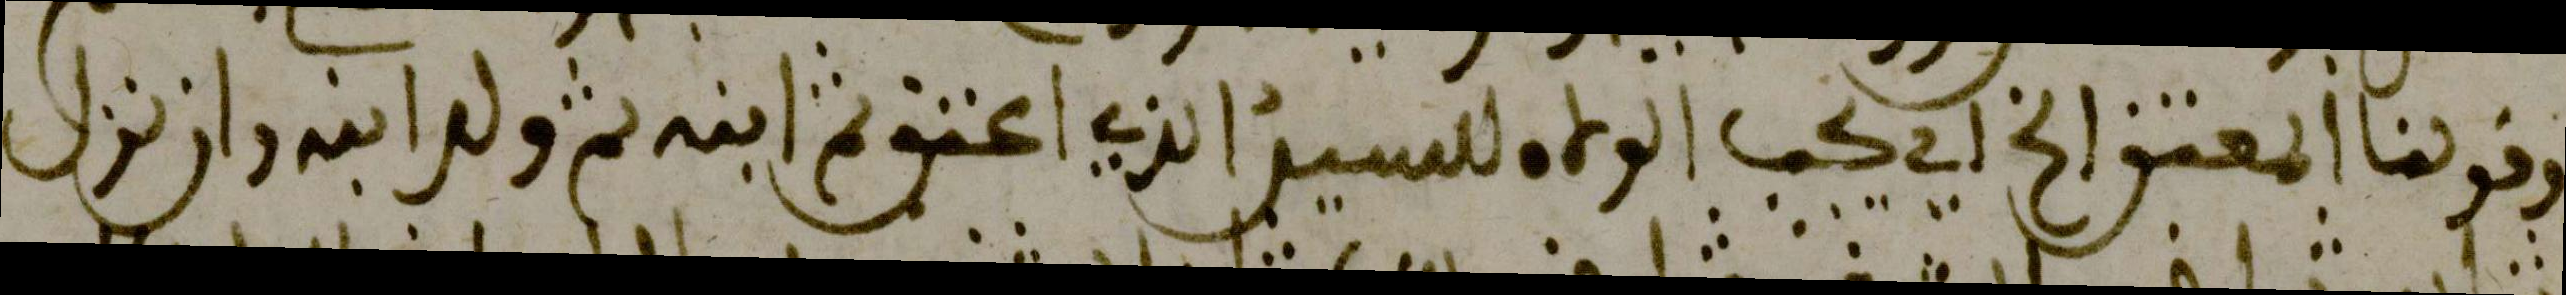وقولنا المعتق الخ اي يحجب الولاء للسيد الذي اعتق ثم ابنه ثم ولد ابنه وان نزل
